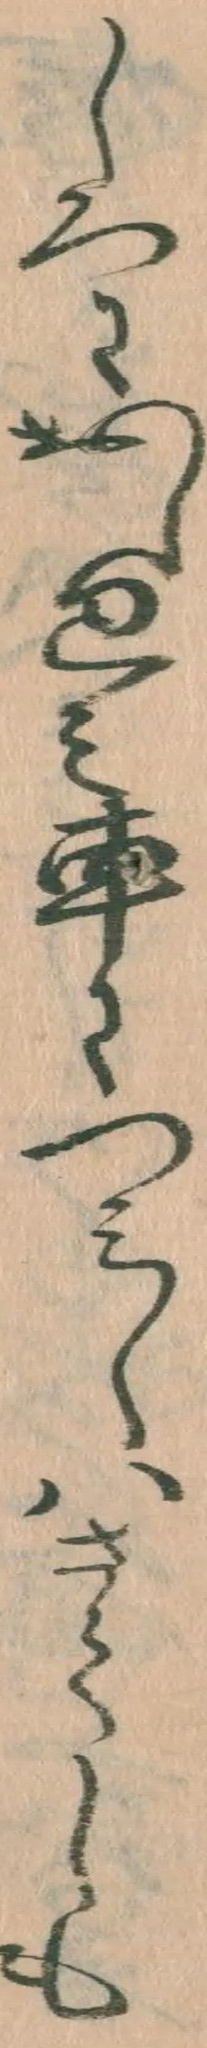しろにおし包ミ車につミしハさてしも
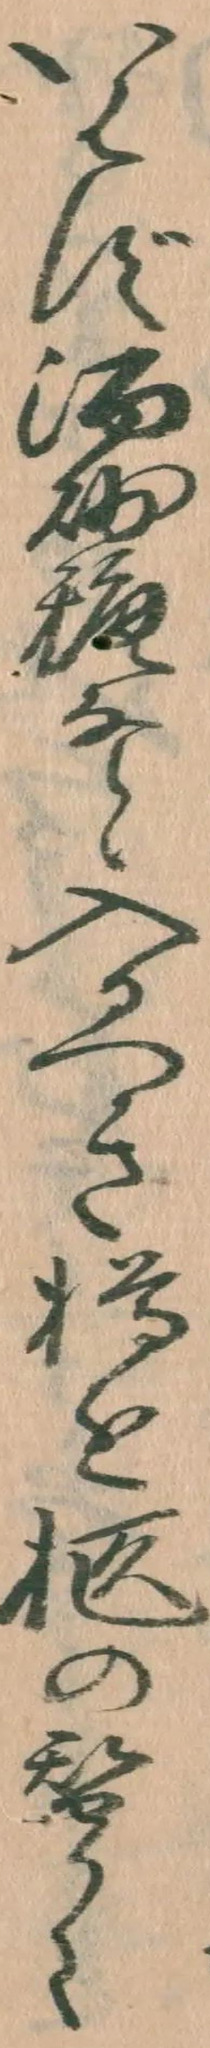いはず酒砂糖なと入るへき樽を柩の替りに
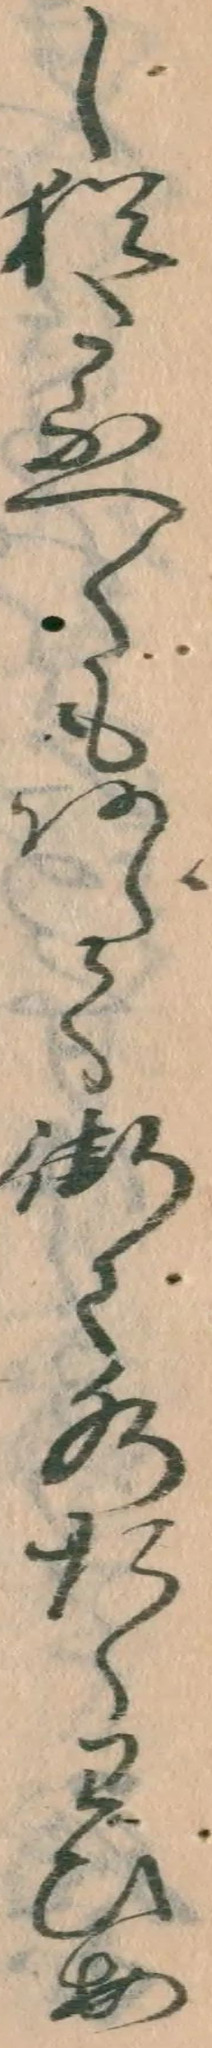し猶たるへくもあらて街に水たくわひあ
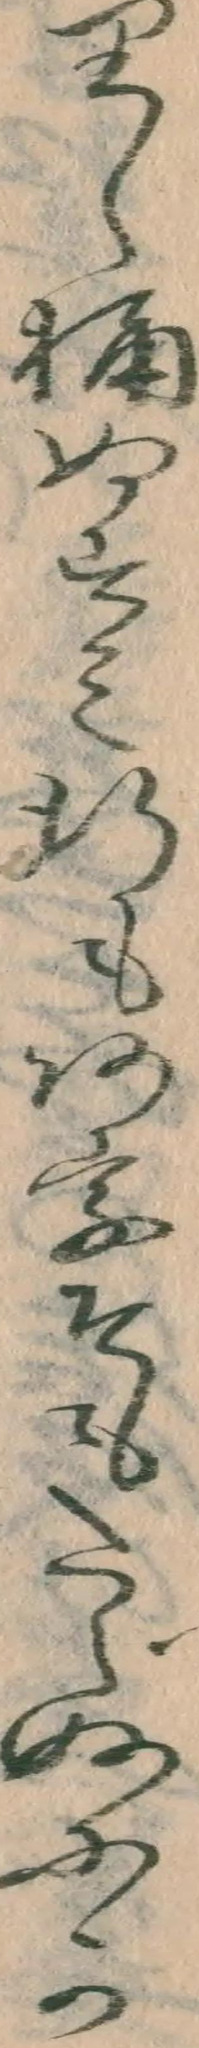りし桶ぬすミ行もありそもたらぬにか
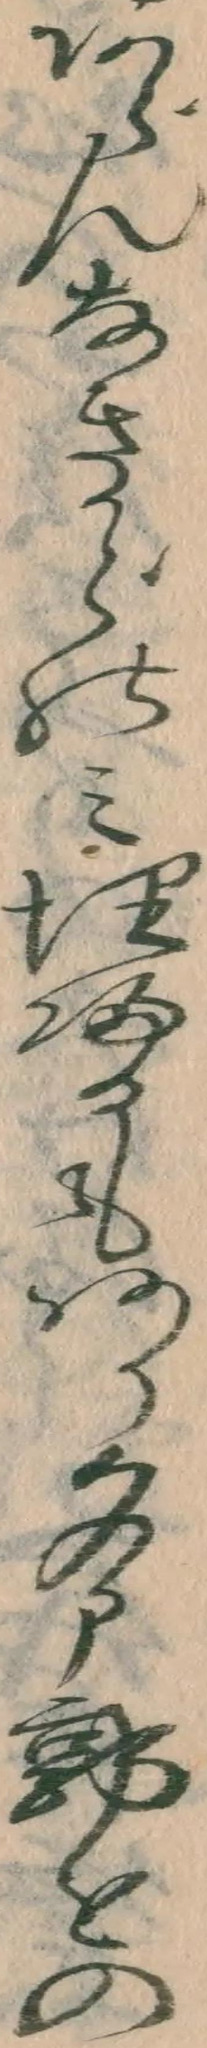あらんなきからのミ埋帰るもあり夕へ廓をの
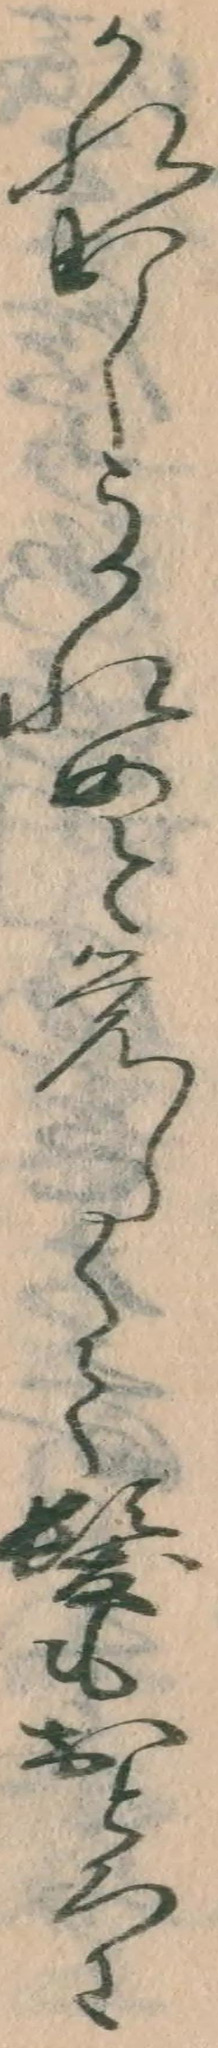かれ出しうかれめと覚しくて髪もおとろに
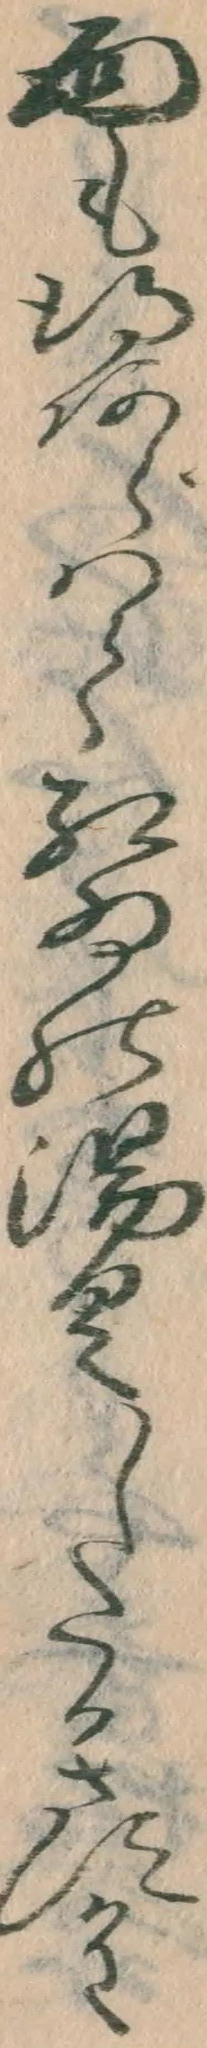面も得あらハて紅ゐの湯具したるさすかに
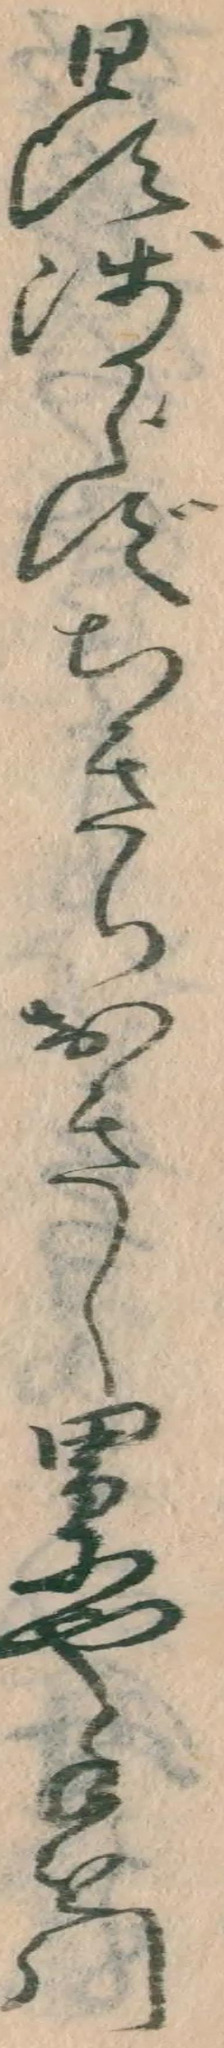日頃浅からずちきりおきし男にや手を引
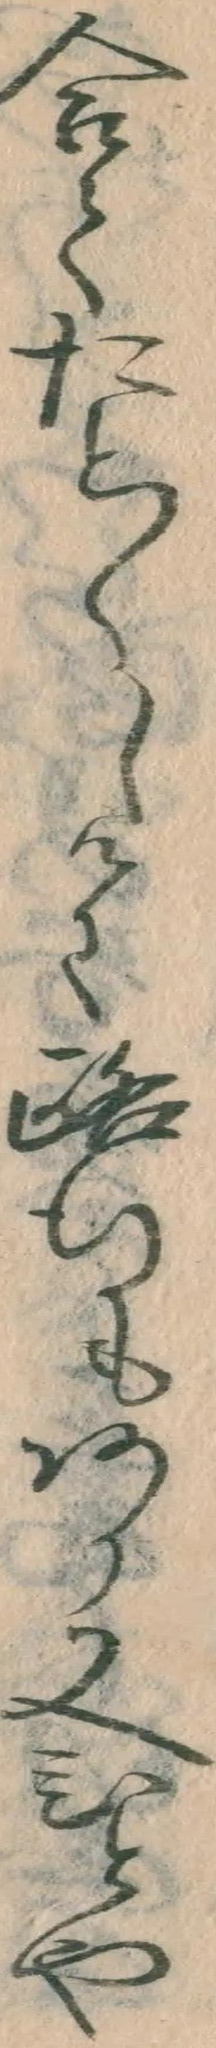合てたと〳〵しけに路行もあり又ひとや
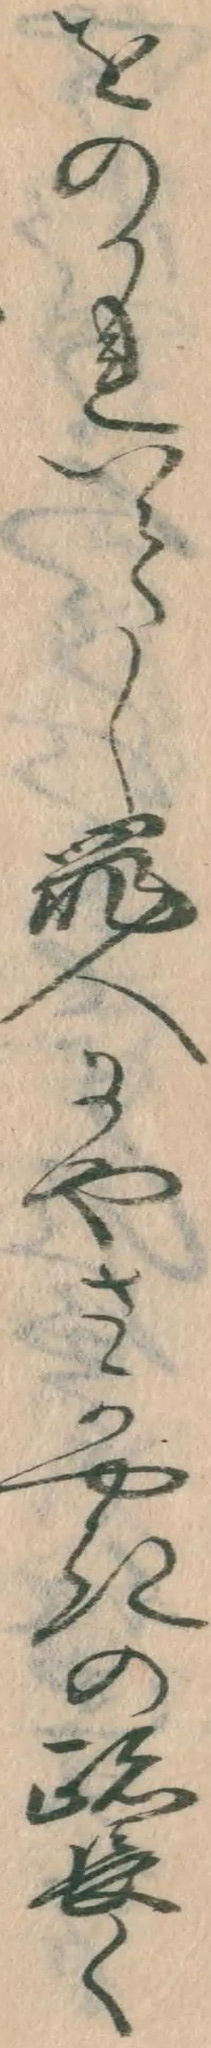をのかれいてし罪人にやさかやきの跡長く
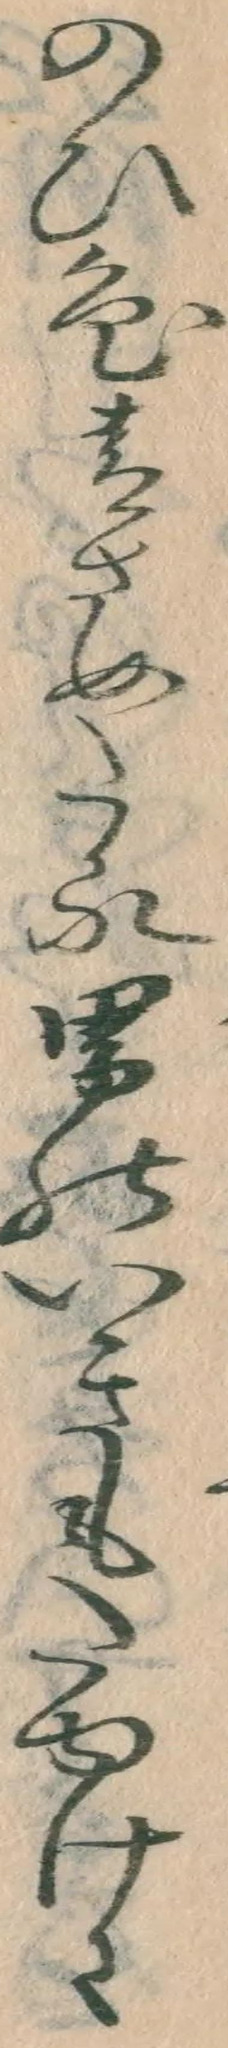のひ色青さめたる男のいきもたゆけに
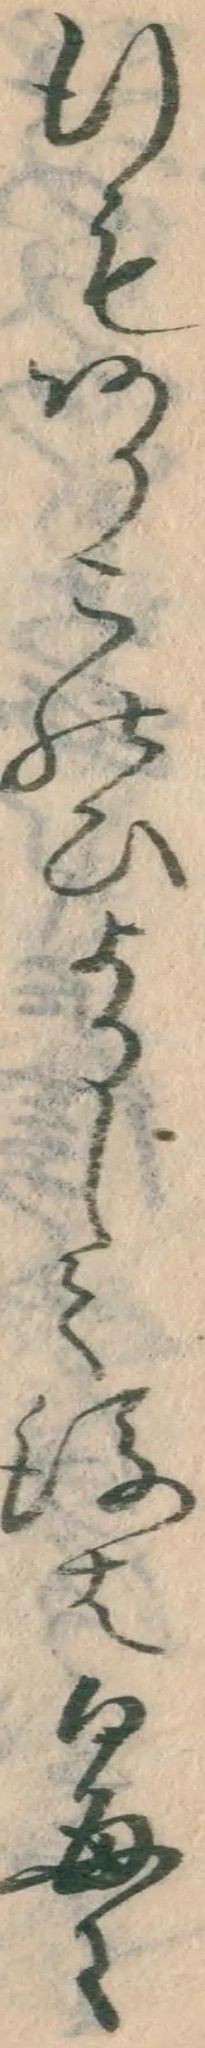行もありこのひよりして後は日毎に
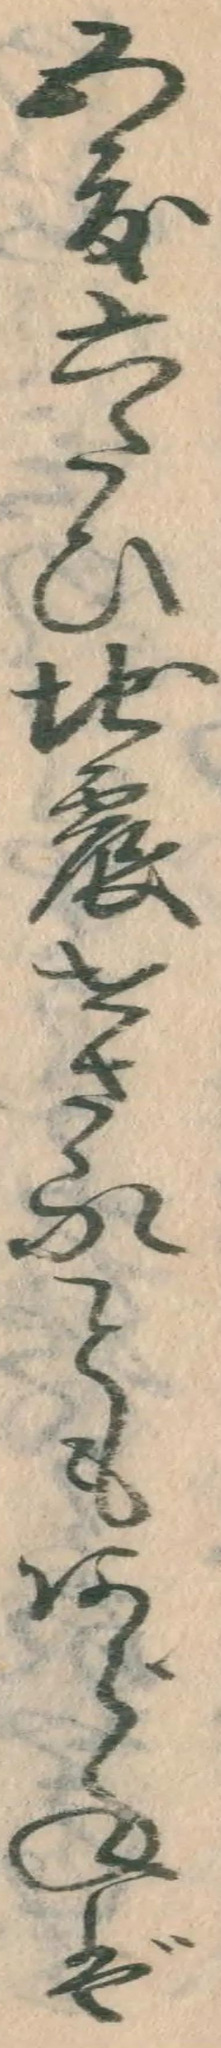五度六たひ地震せさることもあらねば
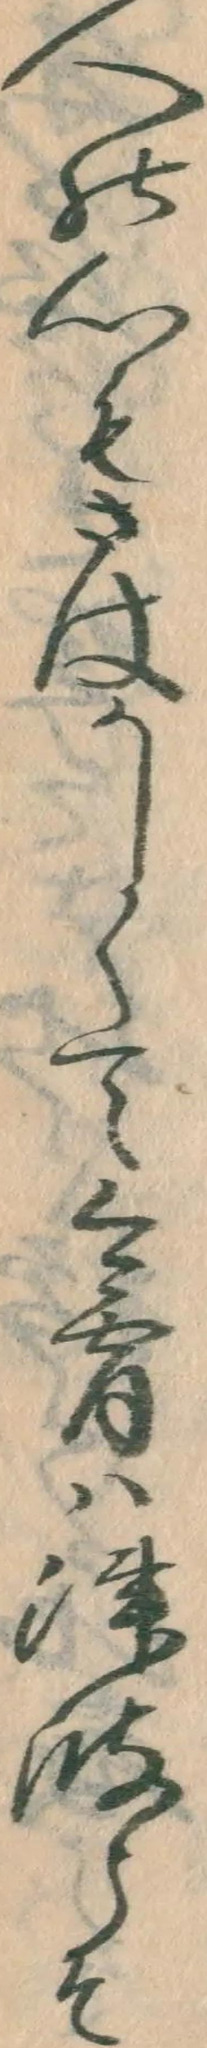人の心もさはかしくて今宵ハ津波こそ

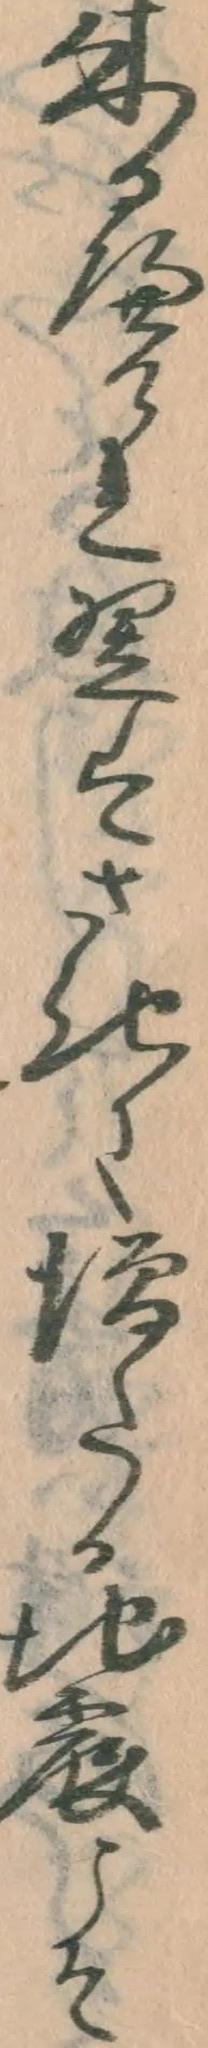来るへけれ翌はさきに増たる地震こそ
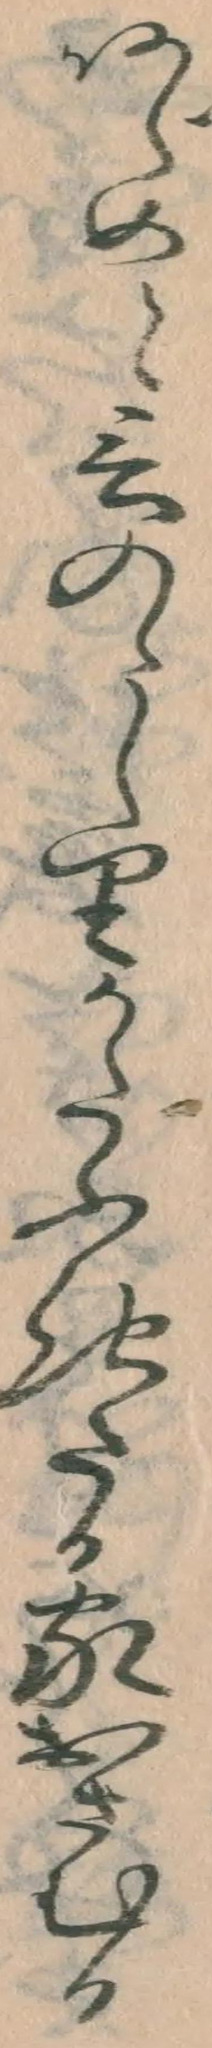あらめと云のゝしりかたふきたる家おさむる
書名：麗斎叢書. 20
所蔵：国立国会図書館 National Diet Library, JAPAN
